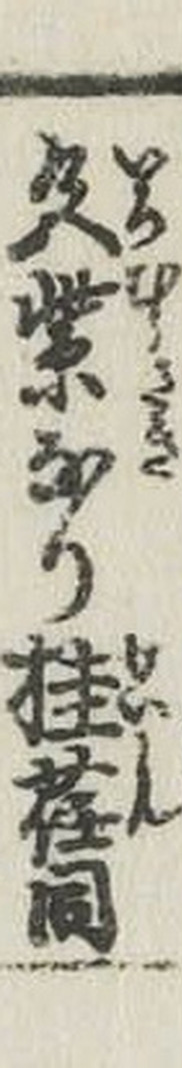色紫なり桂荏同
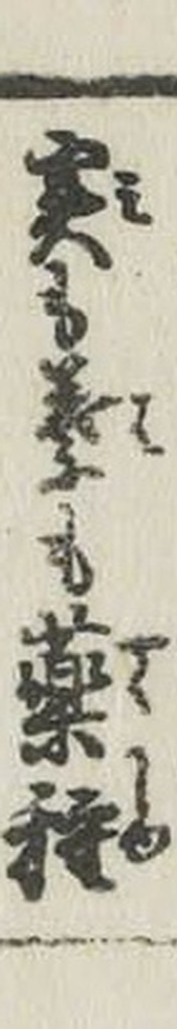実も葉も薬種
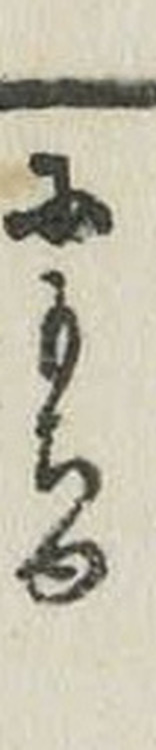にもちゆ
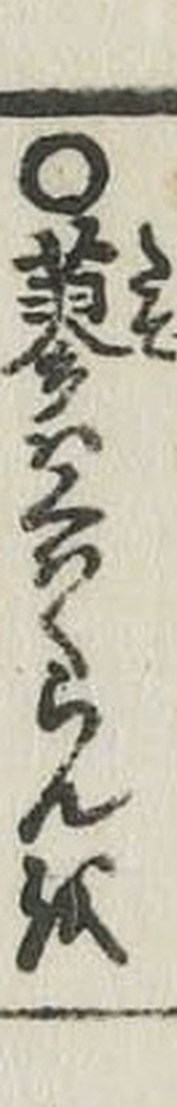○蓼はくわくらんを
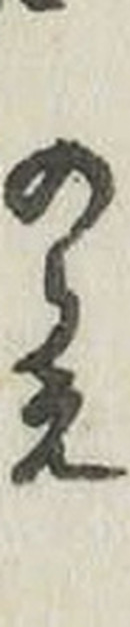のらえ
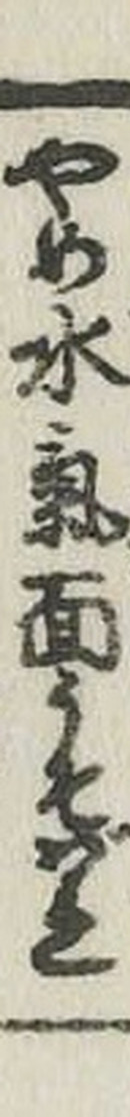やめ水気面うそばれ
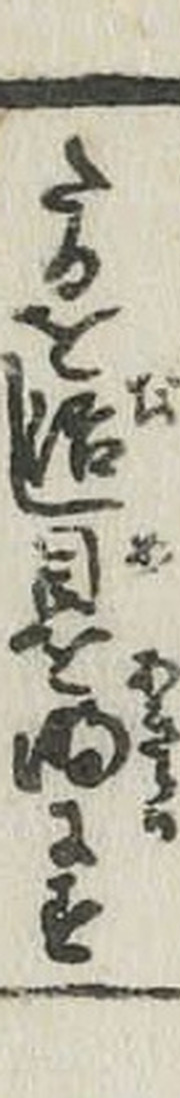たるを治し目を明にす
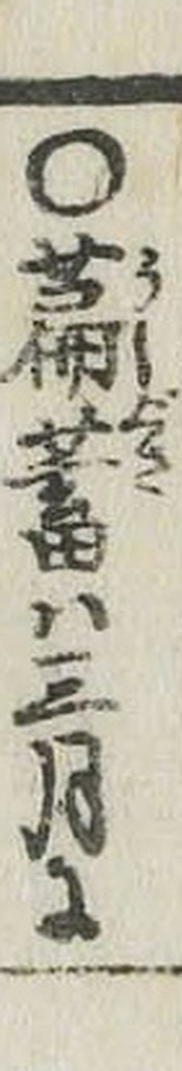○萹蓄は三月に
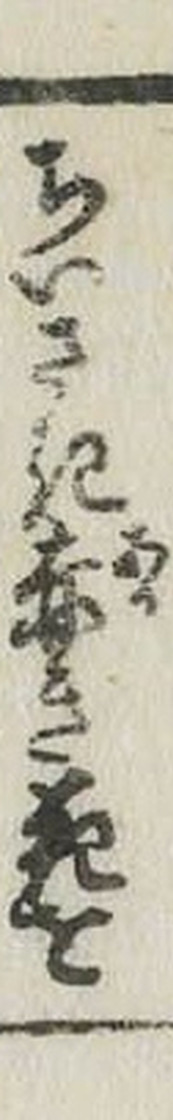ちいさき赤き花を
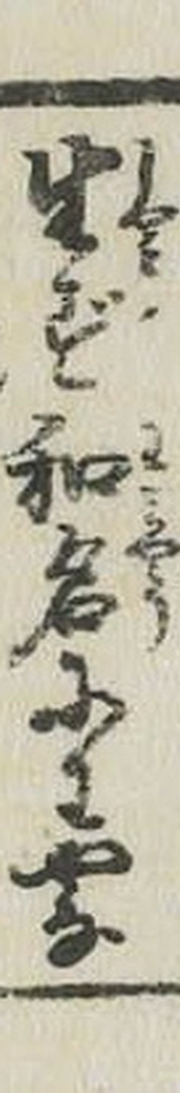生ず和名にわやな
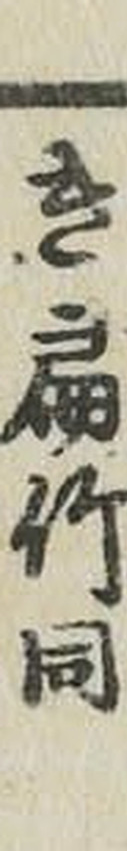き扁竹同

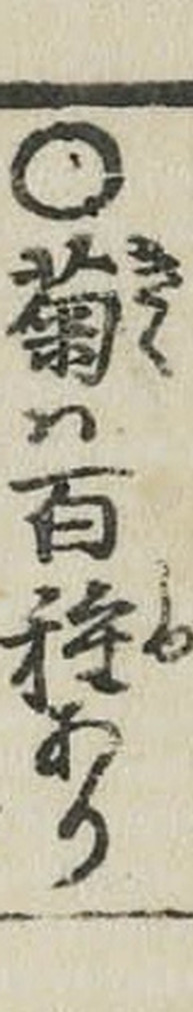○菊は百種あり
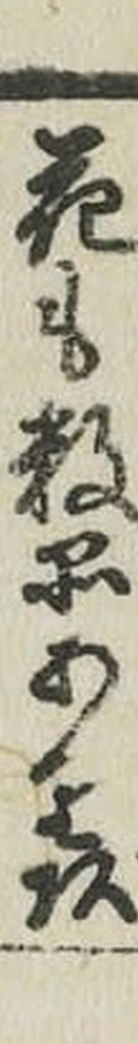花も数品あり頭
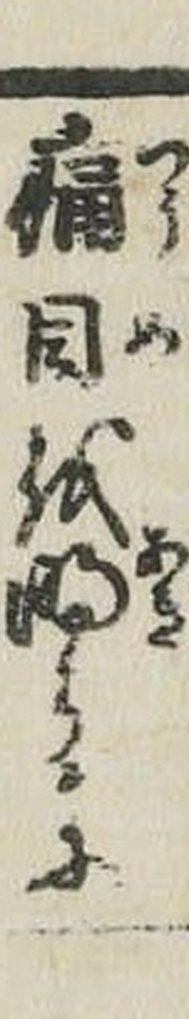痛目を明らかに
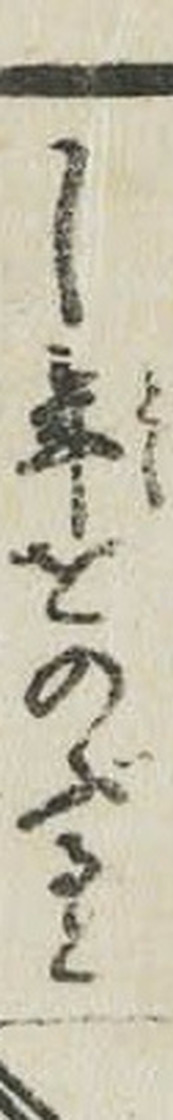し年をのぶると
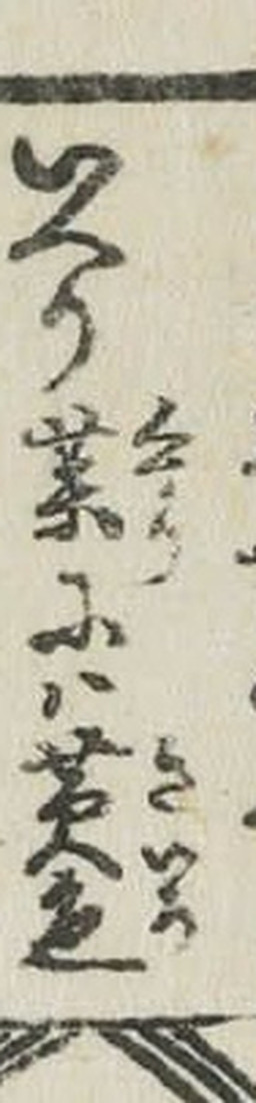いへり薬には黄色
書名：増補頭書訓蒙図彙大成 10巻 9:巻之20
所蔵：東京学芸大学教育コンテンツアーカイブ
